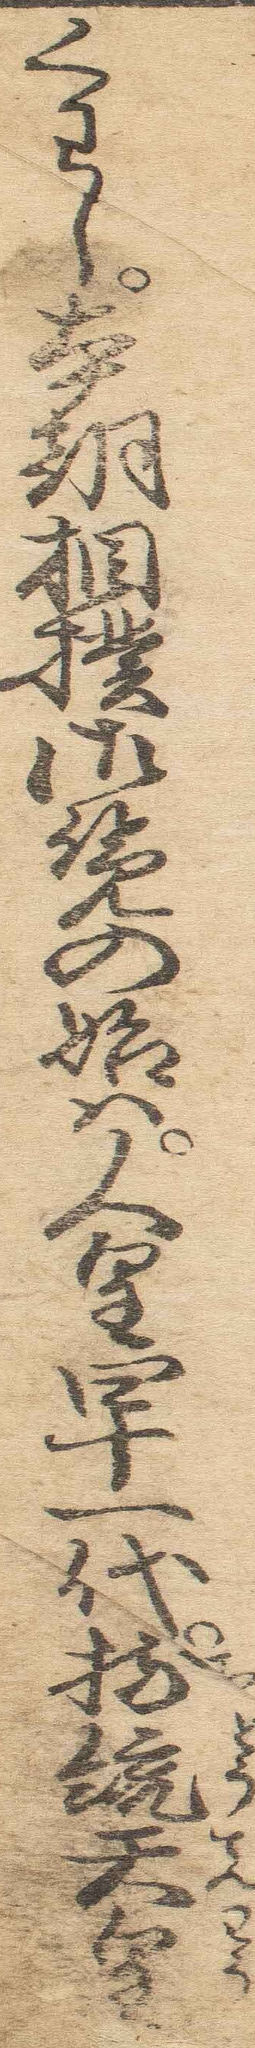くわし。本朝相撲御覧の始は。人皇四十一代。持統天皇の九
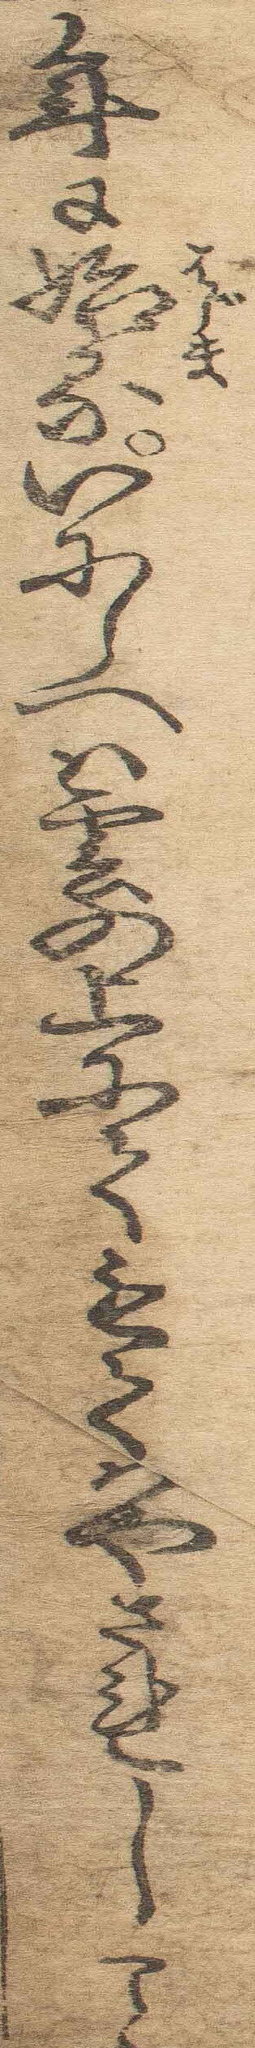年に始る。いにしへは雲の上にてもてはやされしことなり

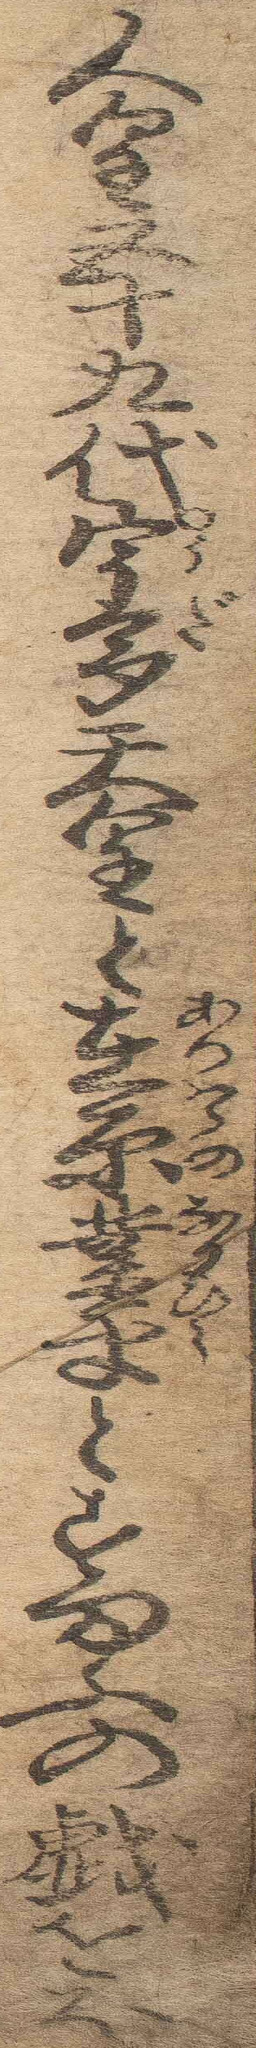人皇五十九代。宇多天皇と有原業平とすまふの戯をな
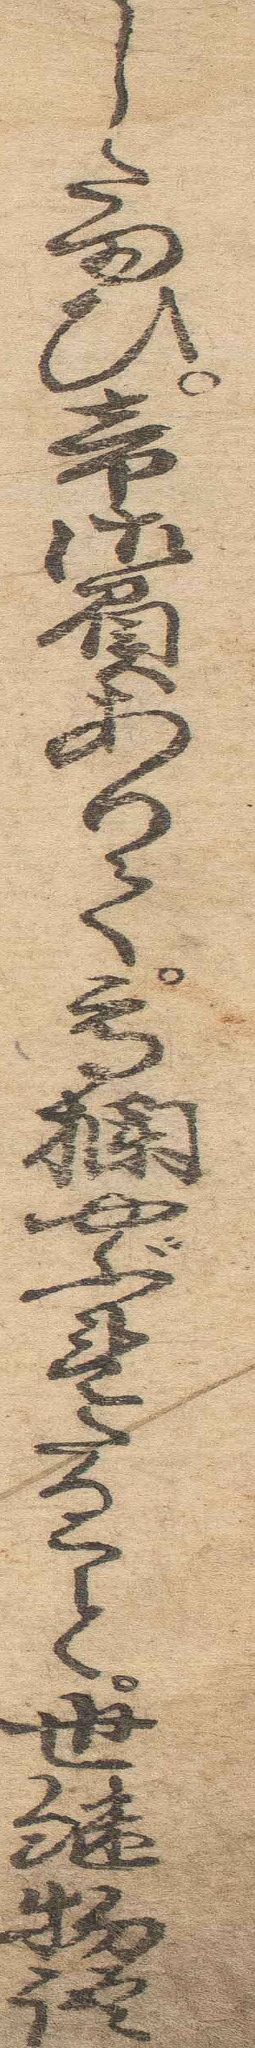したまひ。帝御負ありて。高欄やぶれたること。世継物語
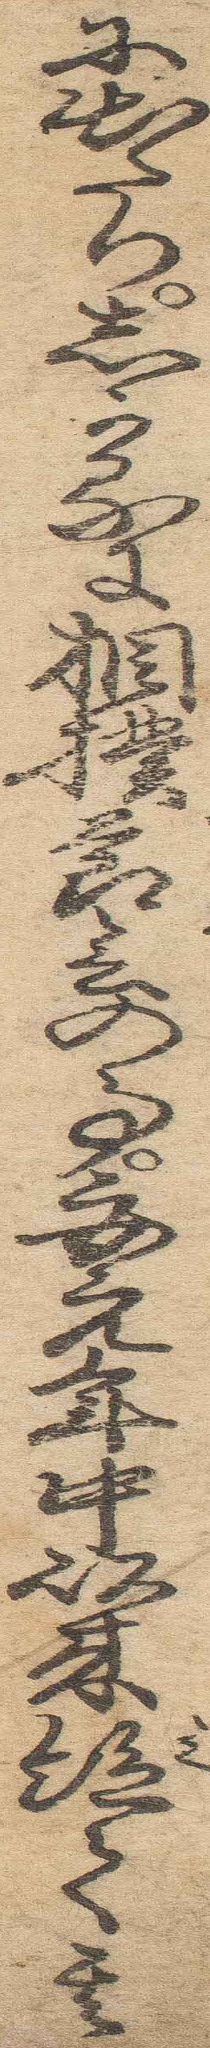に出たり。しかるに相撲節会の事。安元年中以来絶て其
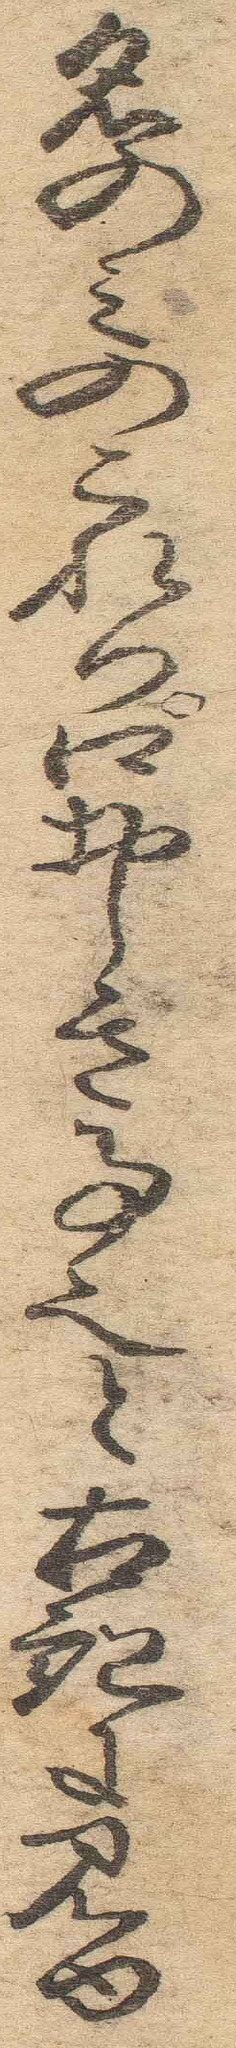名のみのこれり。口おしき事也と古記に見ゆ
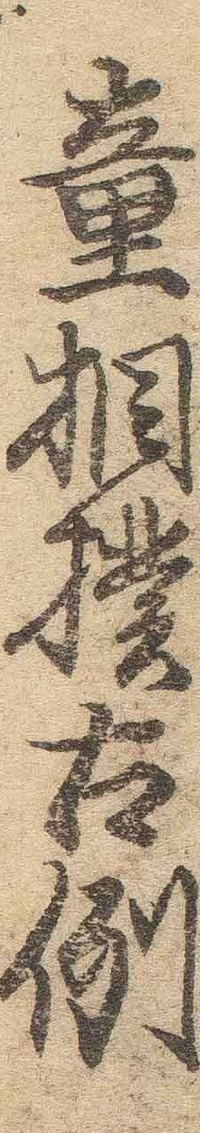童相撲古例
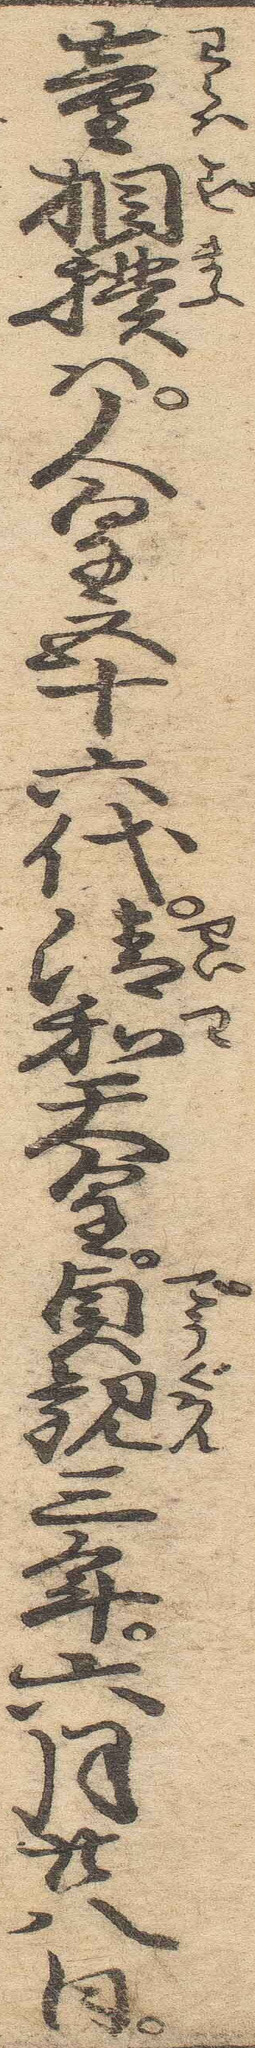童相撲は。人皇五十六代清和天皇貞観三年。六月廿八日。
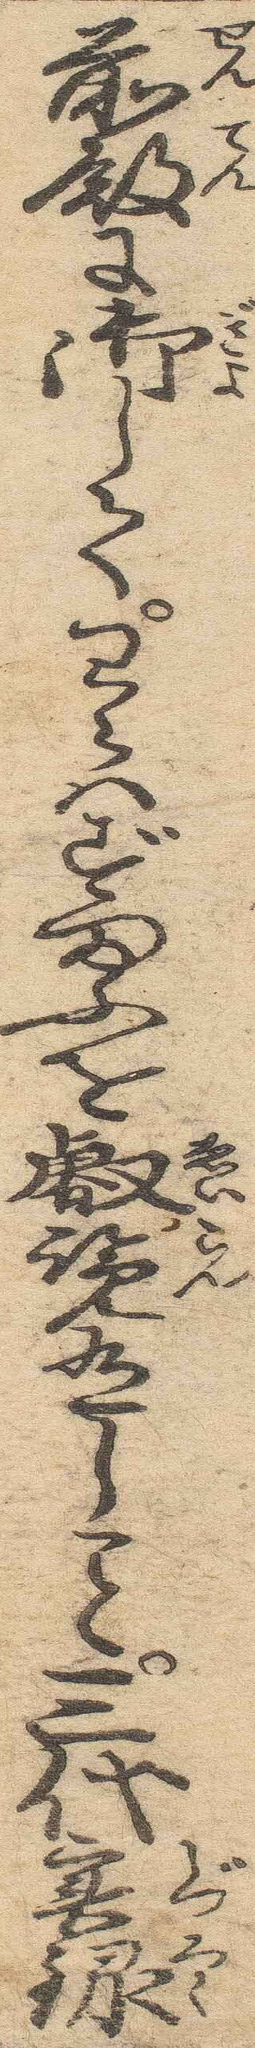前殿に御して。わらはずまふを叡覧有しこと。三代実録
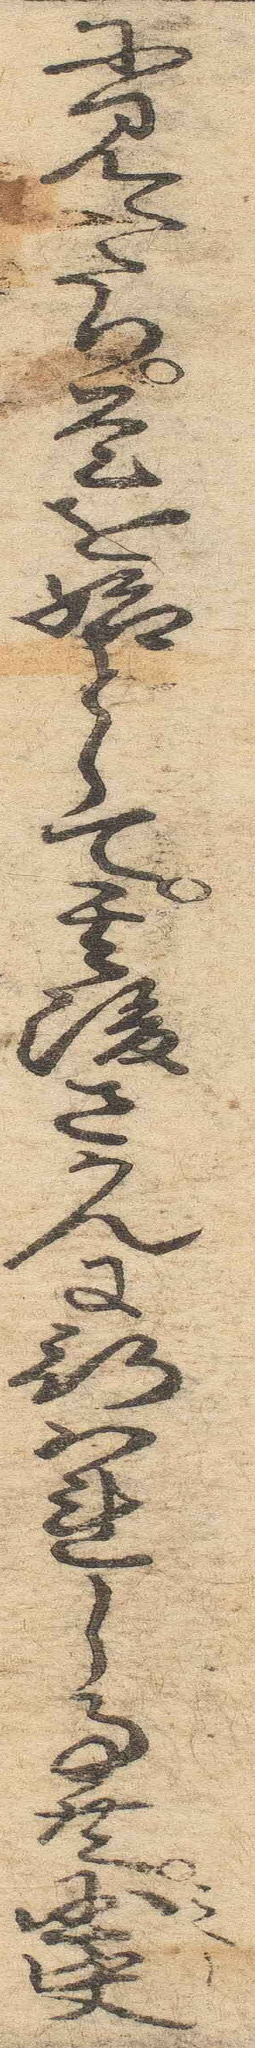に見たり。是を始として。其後さかんに行はれし事共。国史
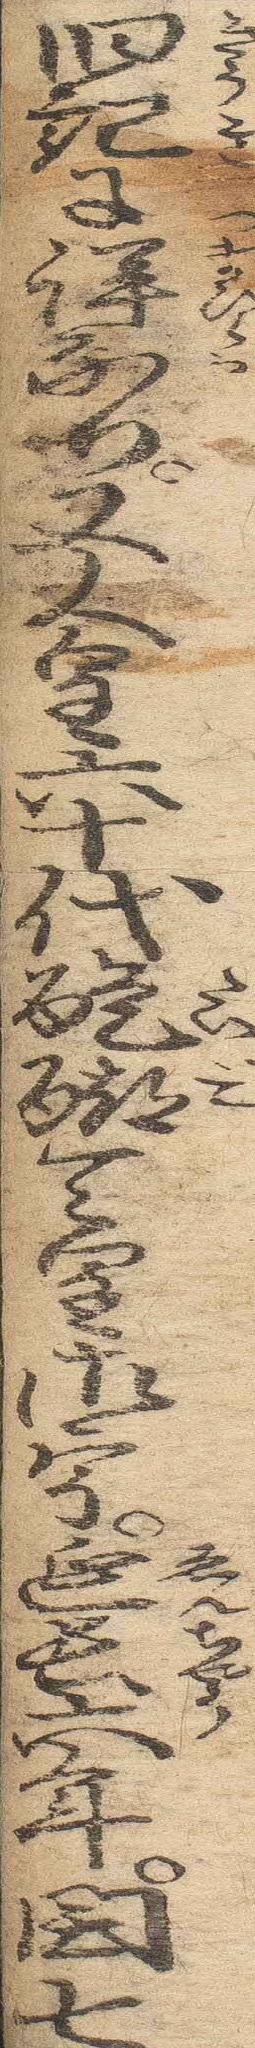旧記に詳なり。又人皇六十代醍醐天皇御宇。延長六年。閏七
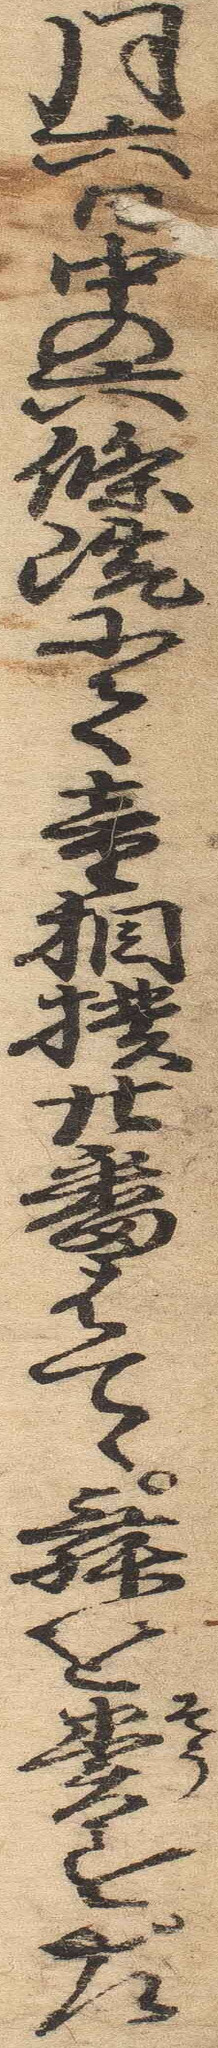月六日中の六條院にて童相撲廿番はてゝ。舞を奏す。右
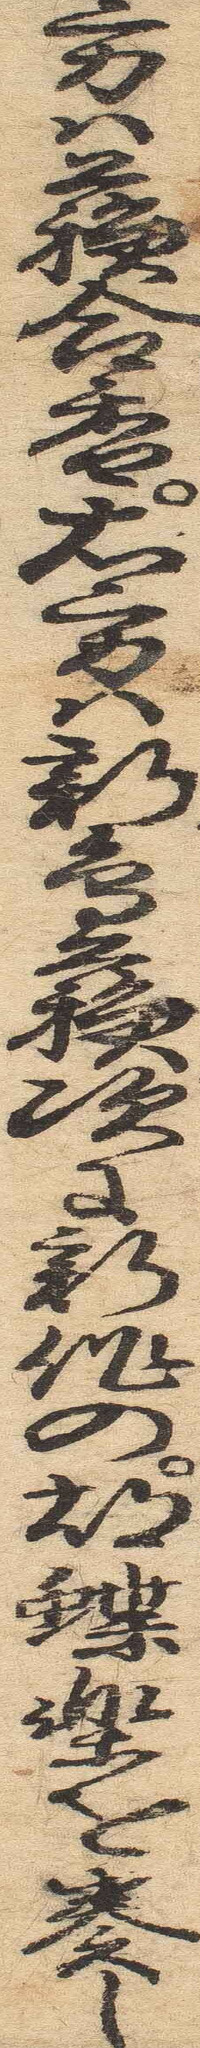方は蘇合香。左方は新鳥蘇。次に新作の。胡蝶楽を奏し
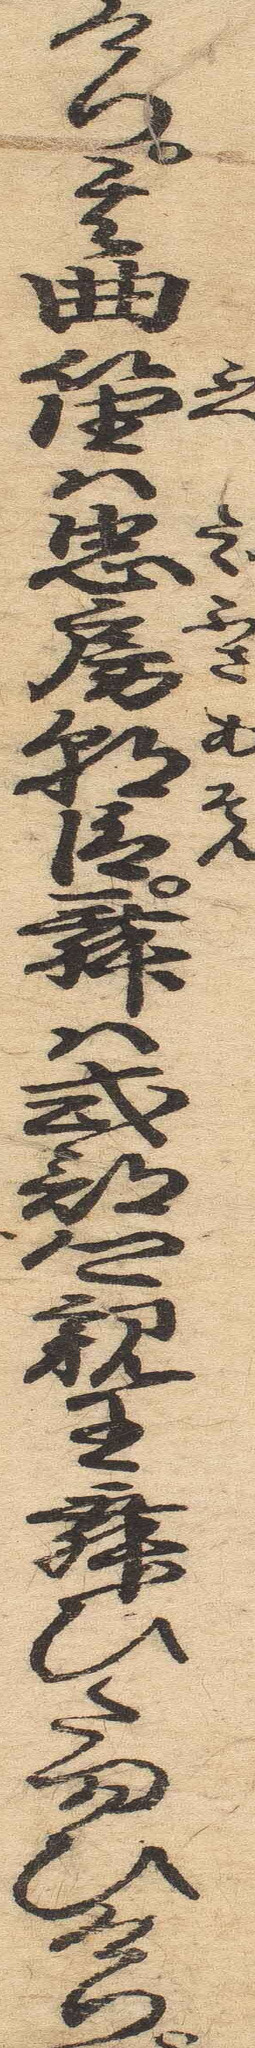けり。其曲笛は忠房朝臣。舞は式部卿親王舞ひたまひけり。
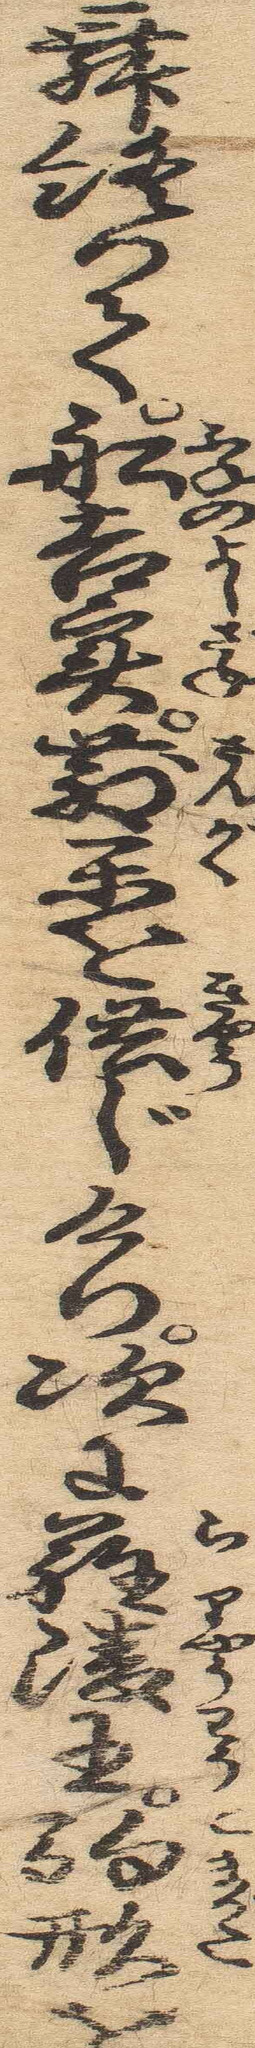舞終りて船吉実。萬楽を供じけり。次に羅陵王。駒形を
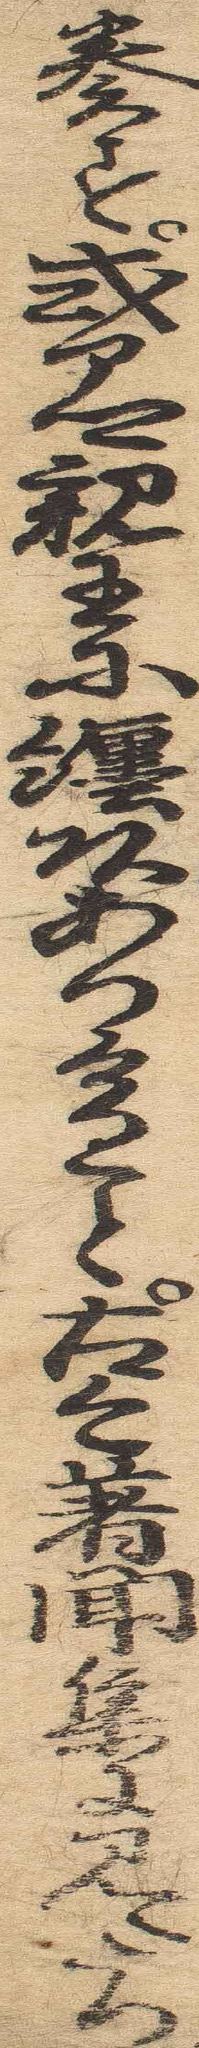奏す。式部卿親王に纏頭ありけること｡古今著聞集に見たり。
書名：古今相撲大全
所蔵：東京学芸大学附属図書館 国文学研究資料館
